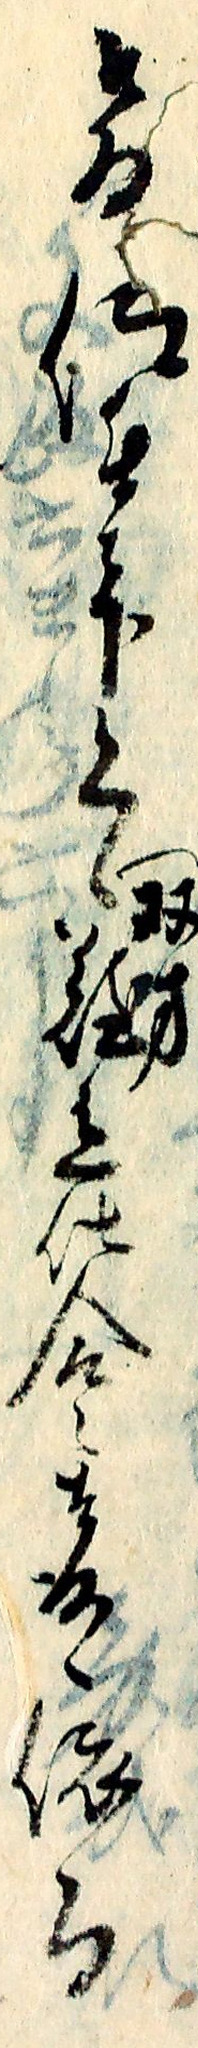被為仰付被下候はゝ双方難有仕合に奉存候依て
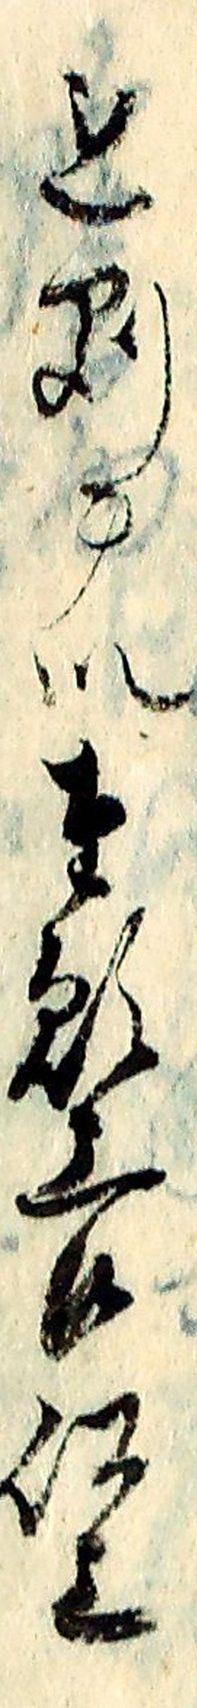連判を以奉願上候以上
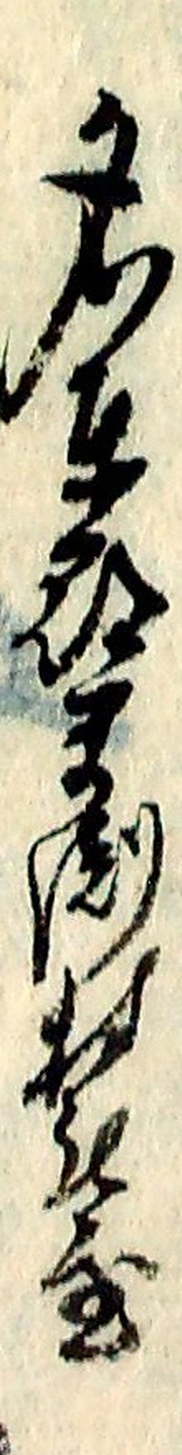名東郡早淵村庄屋
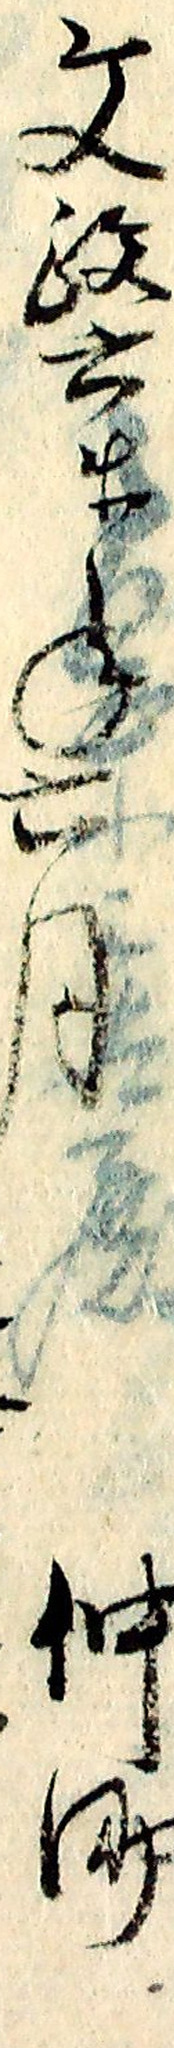文政六午年六月仲助
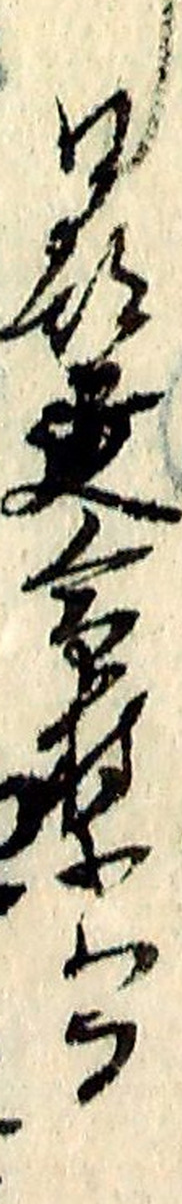同郡延命村五人与
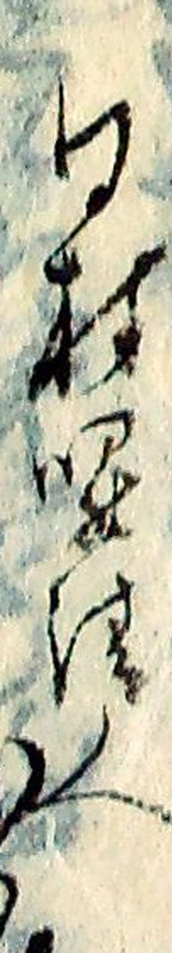同村囉請人
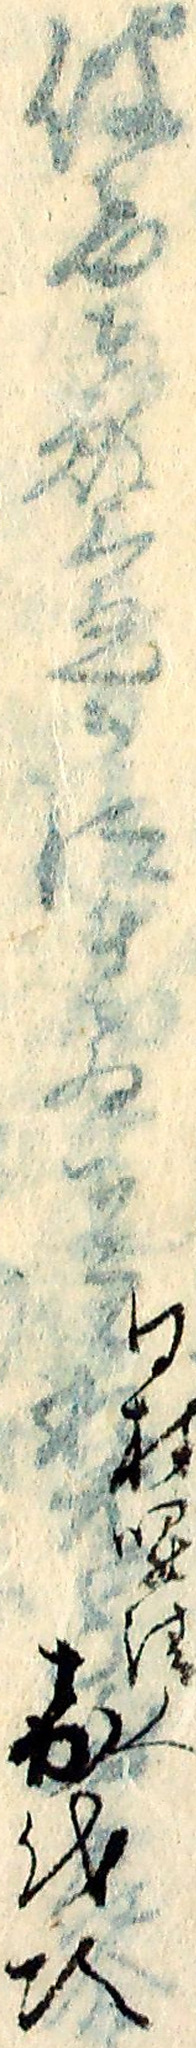同村囉請人
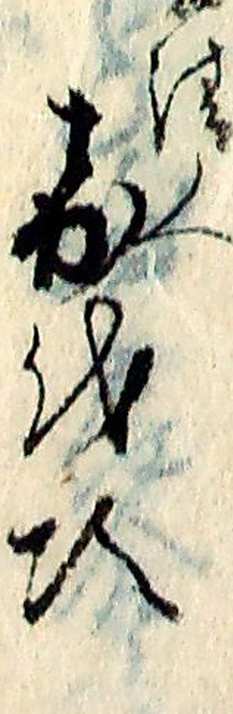嘉代次
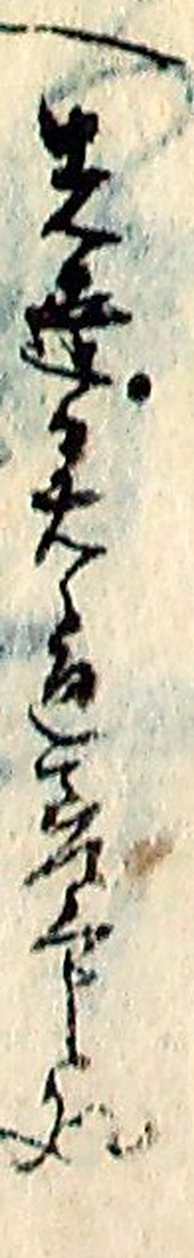先達て右之通差上申候処
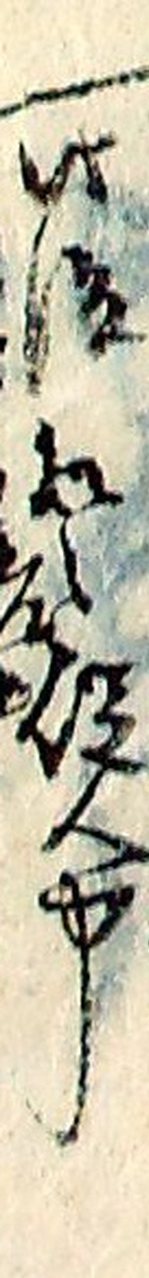此後処之役人中

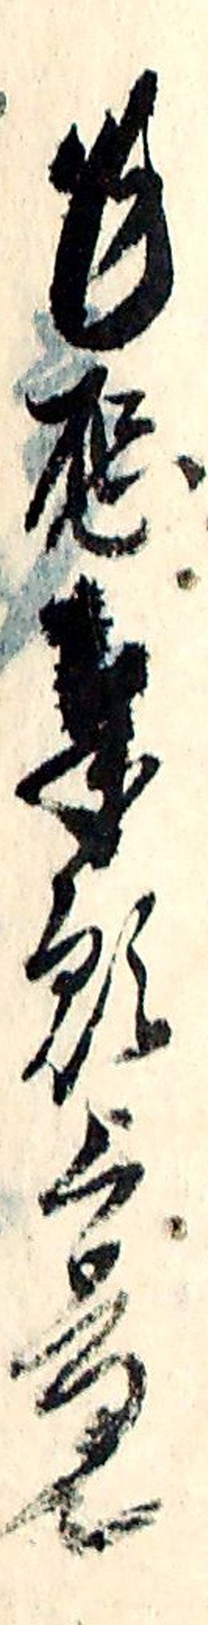乍恐奉願上覚
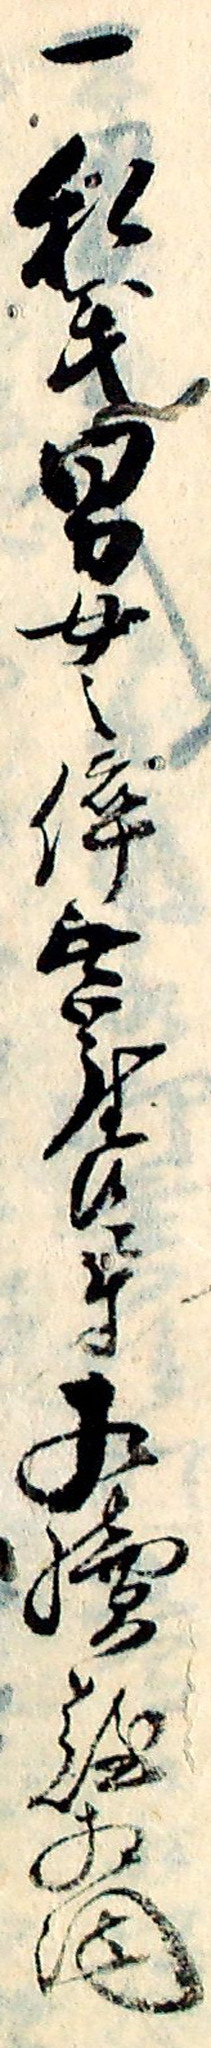一私義男女之倅無御座候に付相続難相調
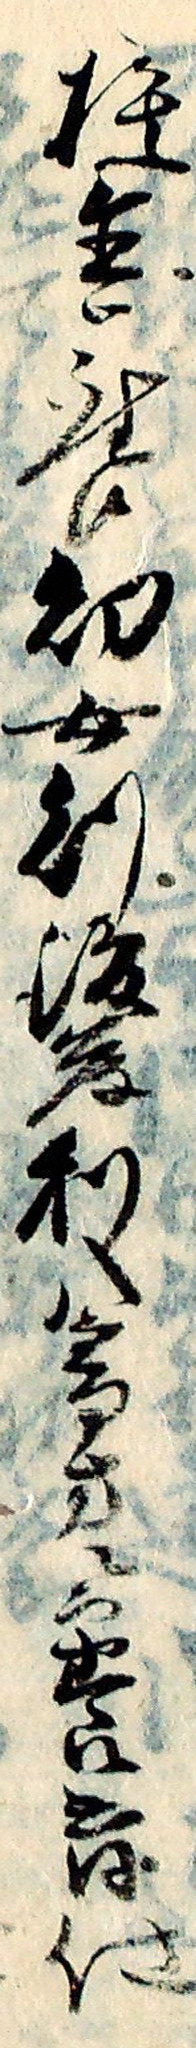捨置御座候幼女則後藤利八郎方にて養育仕
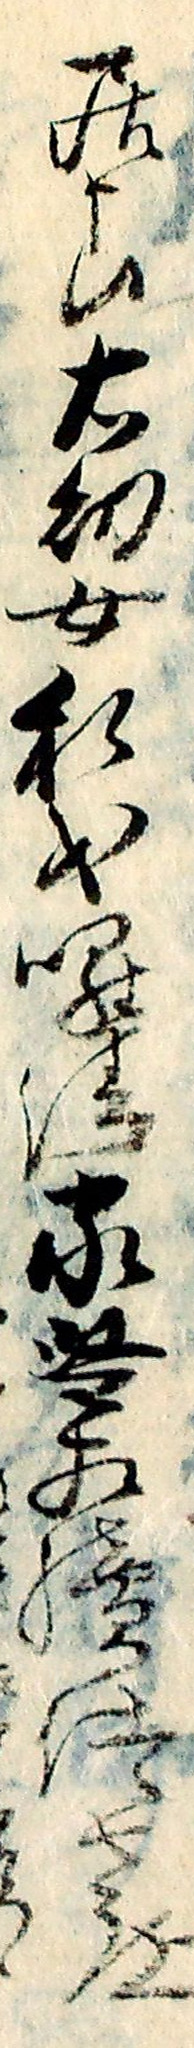居申候右幼女私義囉請家督相続仕らせ度
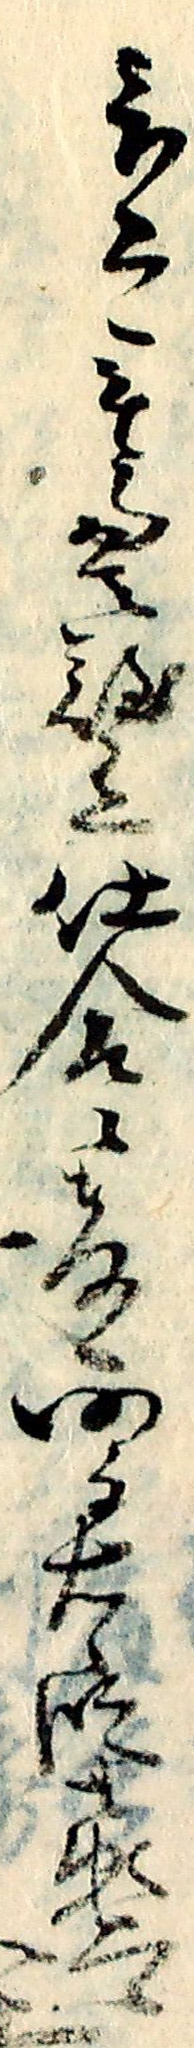被下候はゝ重畳難有仕合に奉存候仍て右之段奉願上候
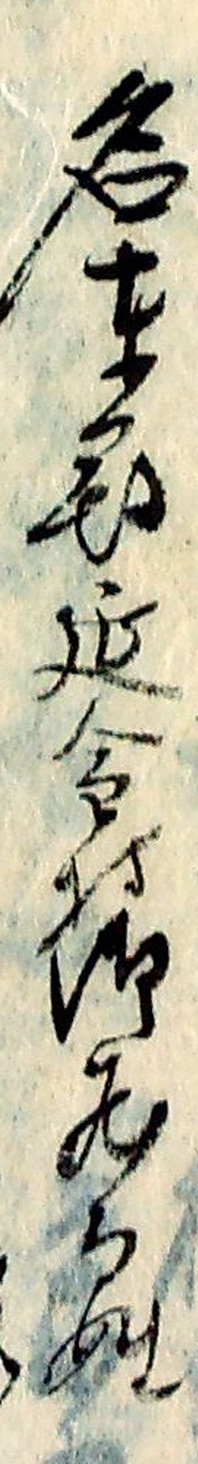名東郡延命村御蔵百姓
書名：諸御願書控(後藤氏壱番）
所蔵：鳴門教育大学 Naruto University of Education
